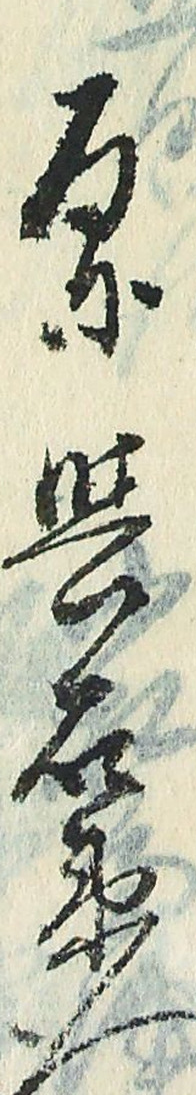原与右衛門
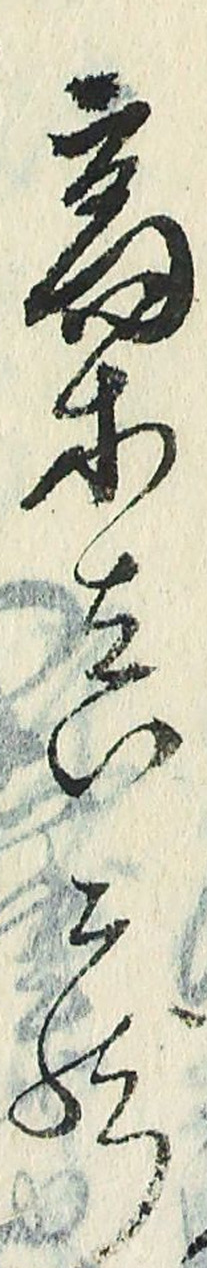高木真蔵
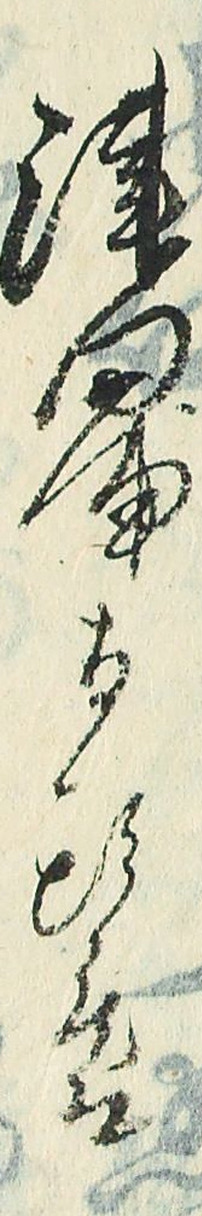津田浦与頭庄屋
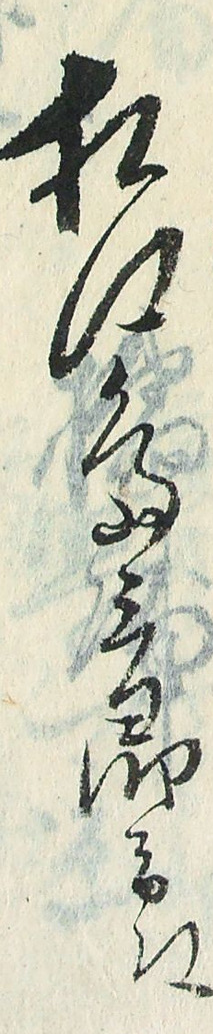松江島三郎方え

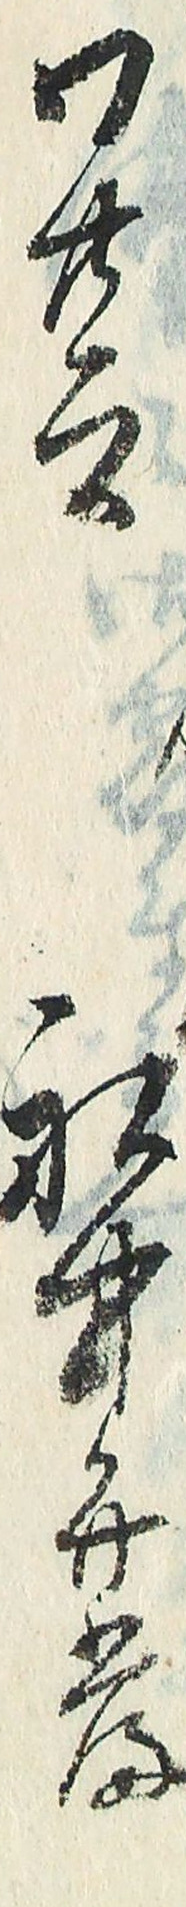同廿二日船中弁当
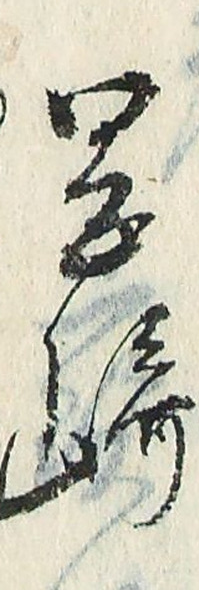泊岡崎
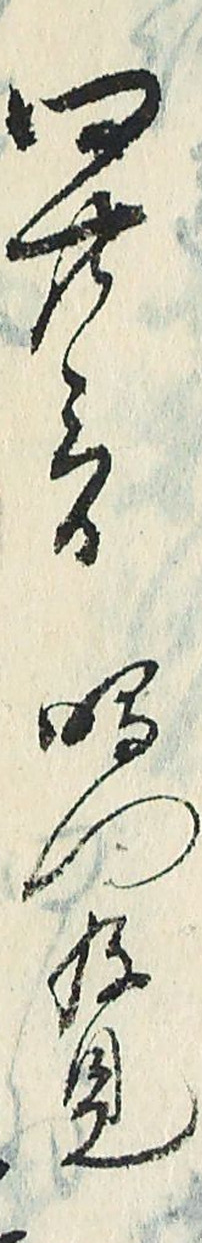同廿三日鳴門及見
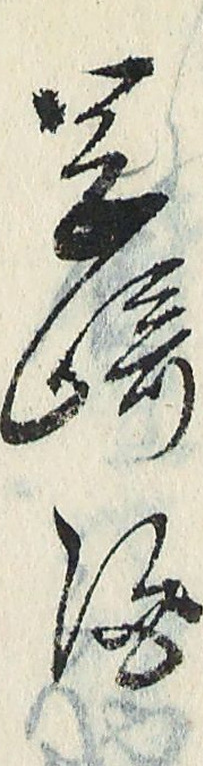岡崎泊
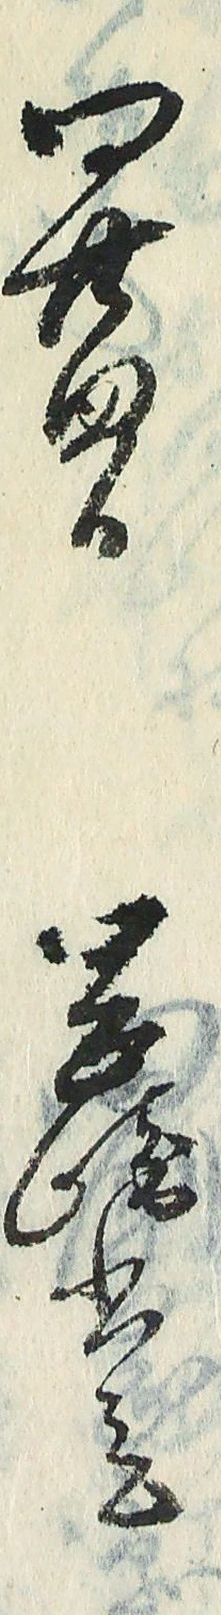同廿四日岡崎出立
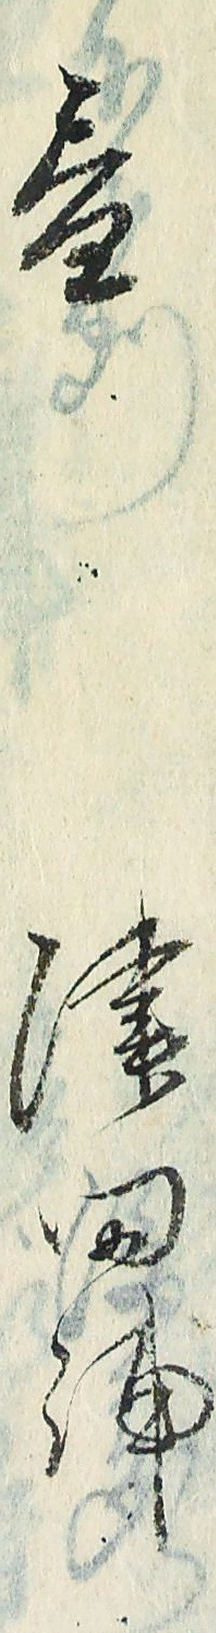昼津田浦
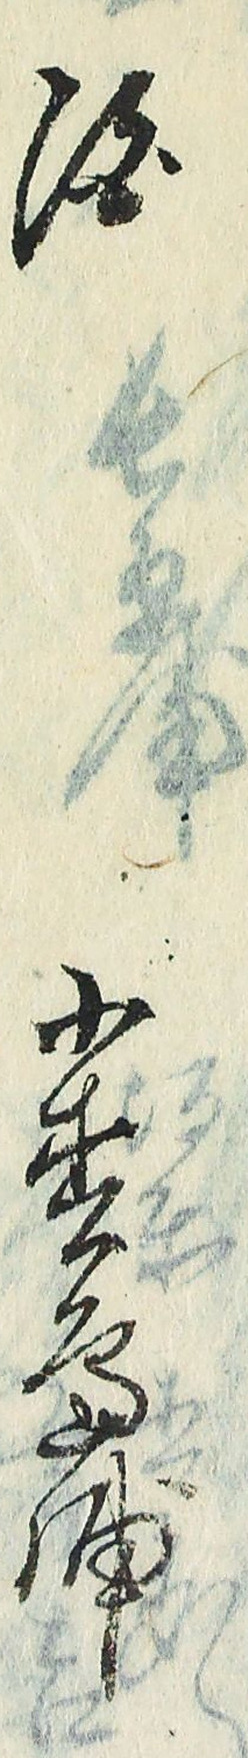泊小松島浦
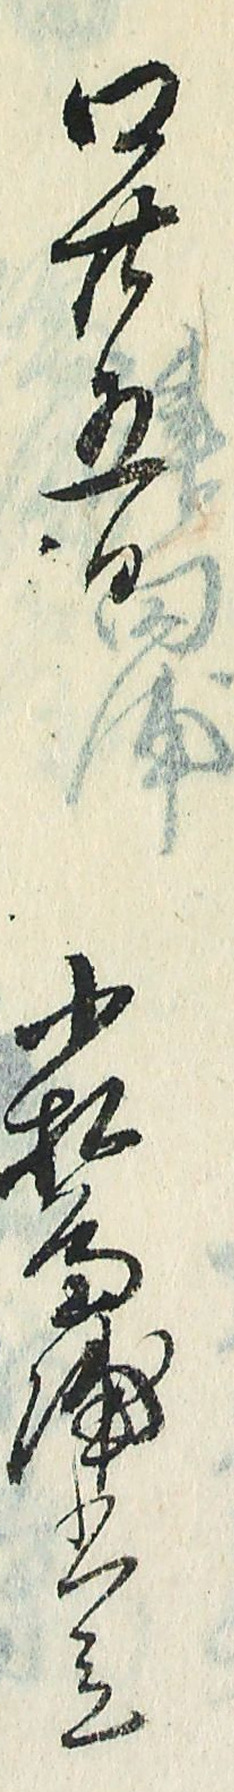同廿五日小松島浦出立
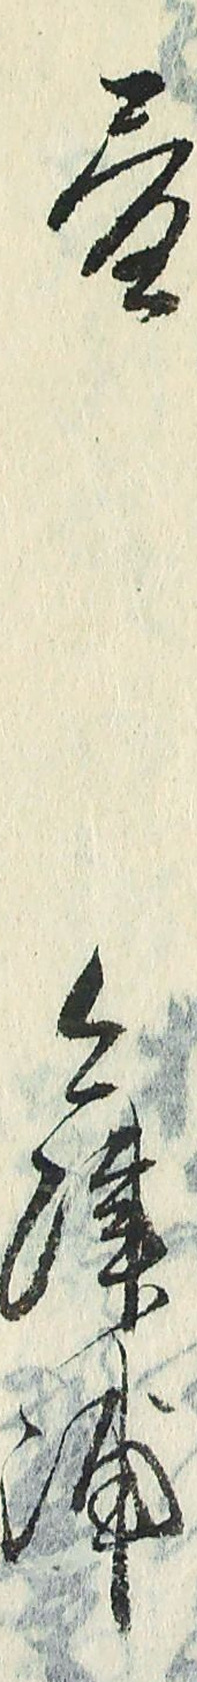昼今津浦
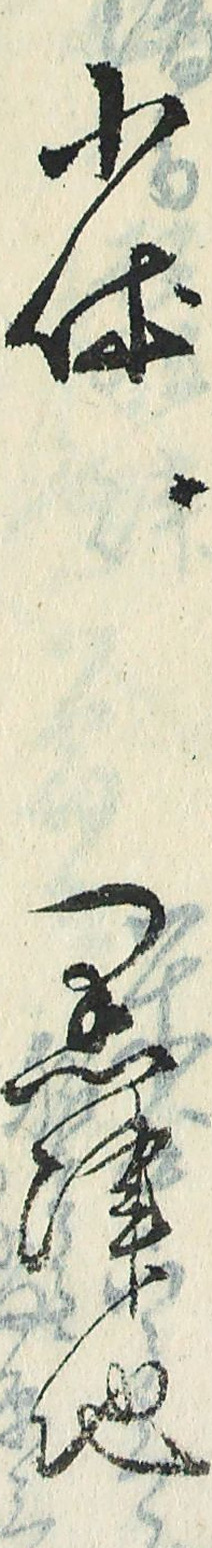小休黒津地
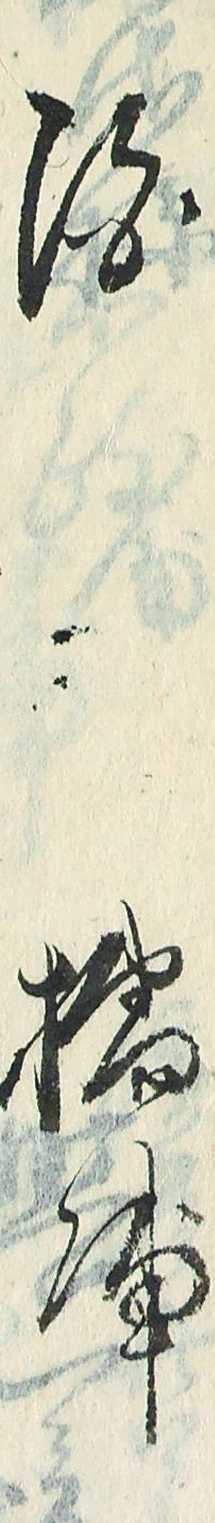泊橘浦

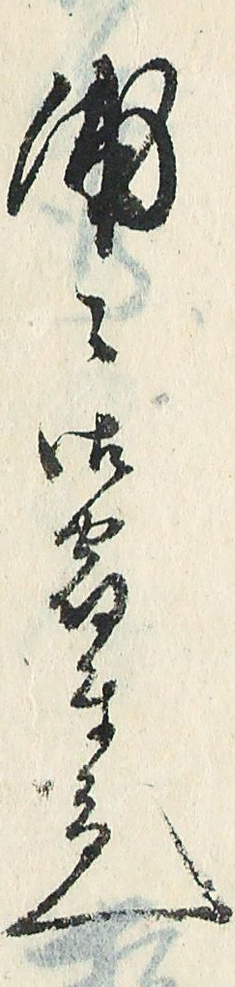浦々御宿付覚
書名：公辺御役人為御廻浦御立越諸御用一巻
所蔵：鳴門教育大学 Naruto University of Education
